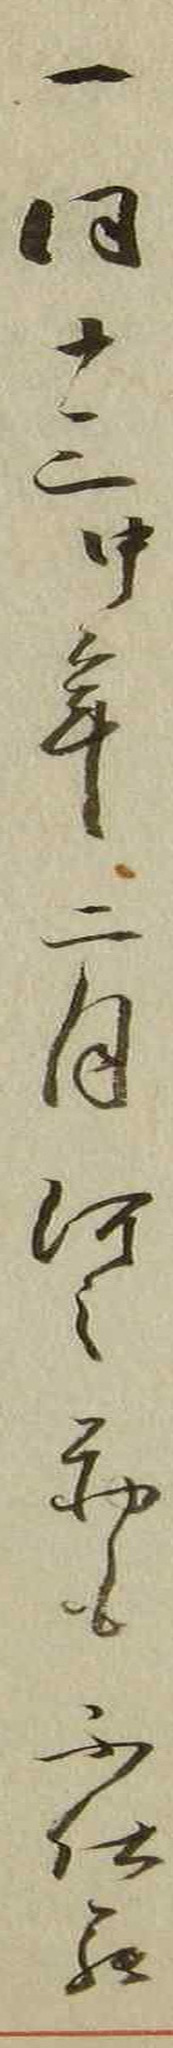一同十三申年二月何之勤も不仕罷
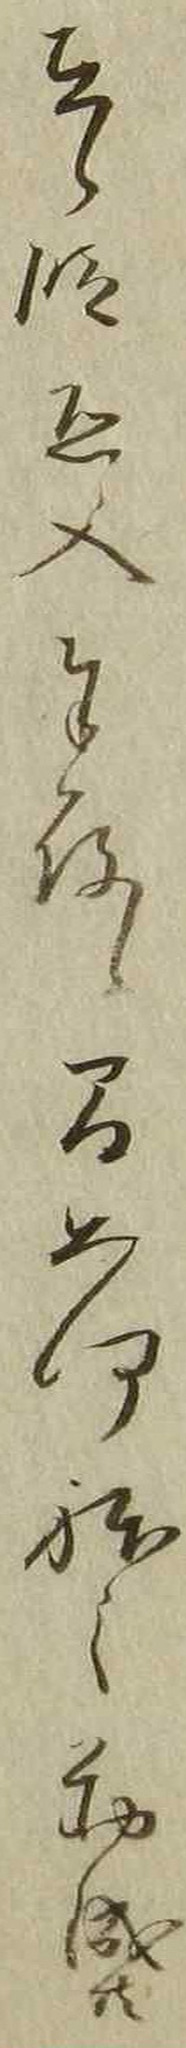在候段恐入奉存候間如何躰之勤成共
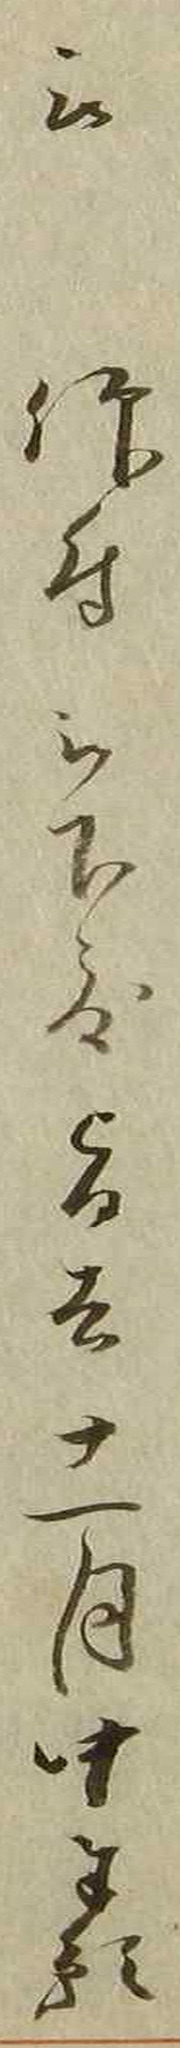被仰付被下度旨去十一月中奉願
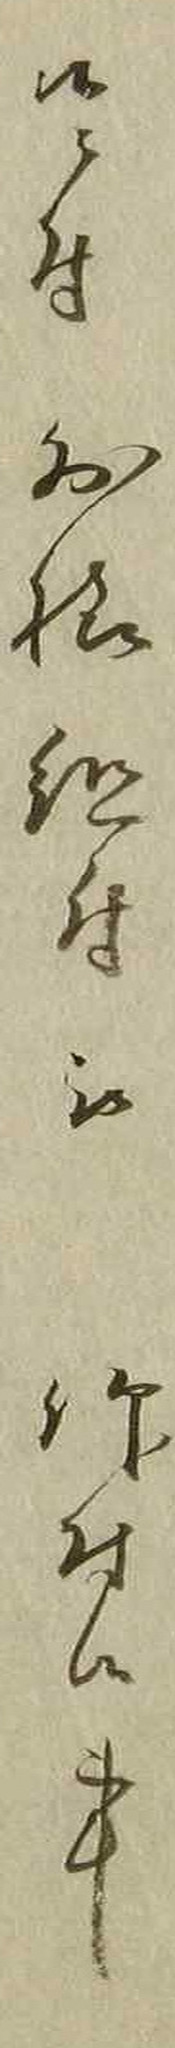候ニ付外様組付被仰付候事
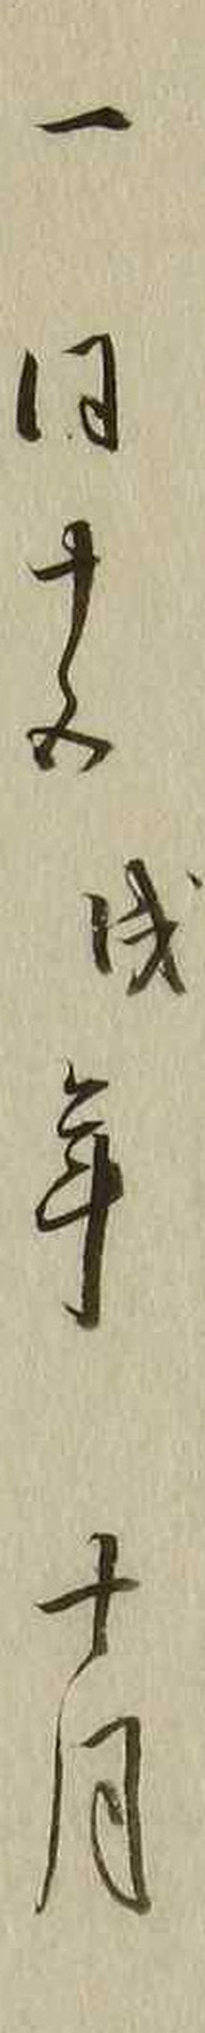一同十五戌年十月
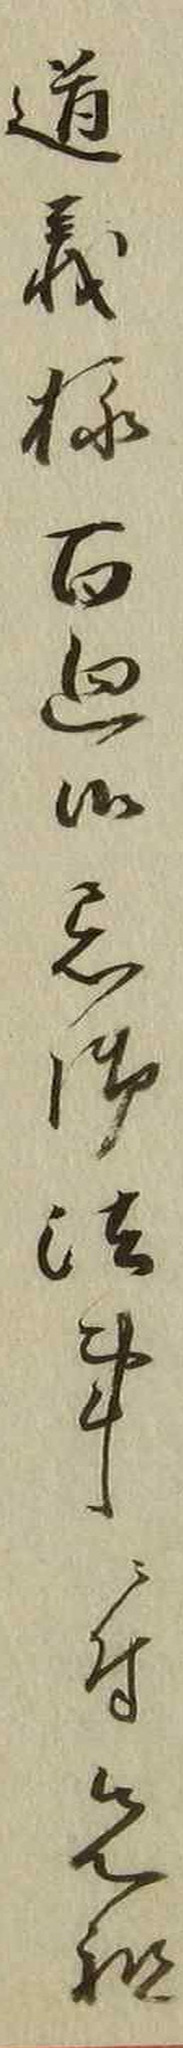道義様百廻御忌御法事ニ付先祖
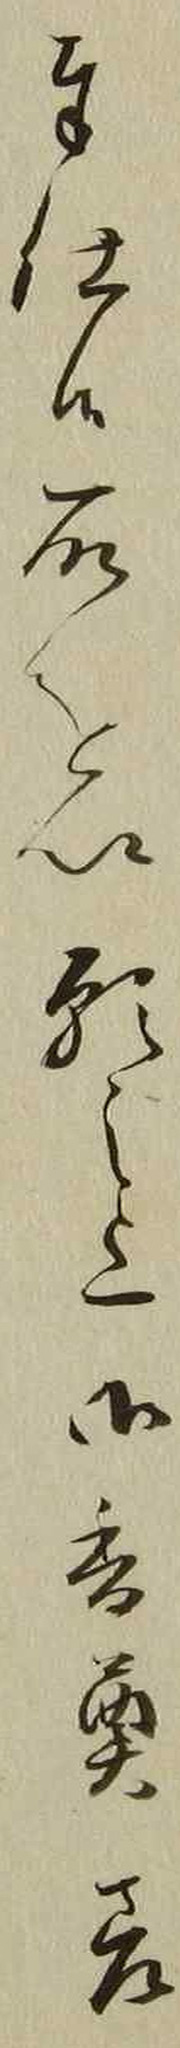奉仕候故を以願之上御香奠差
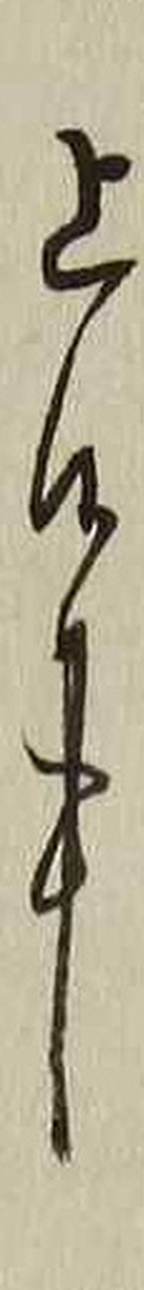上候事
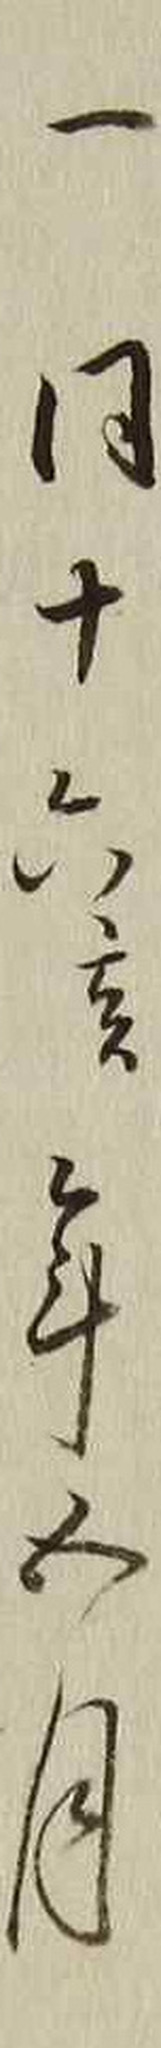一同十六亥年五月
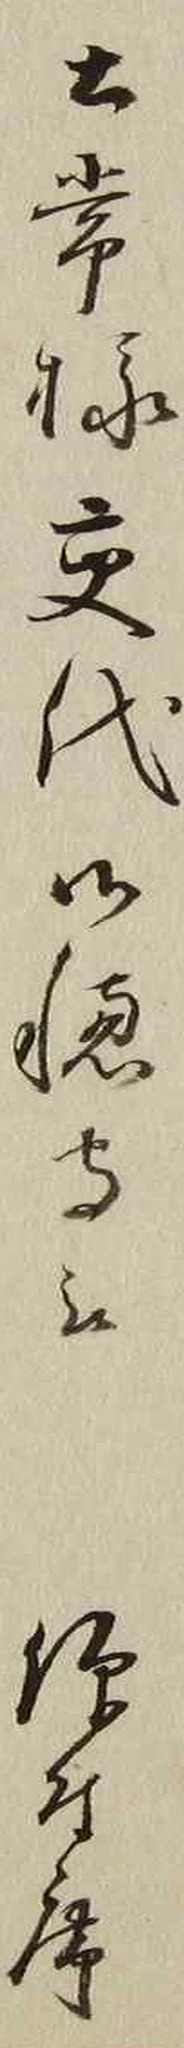土常様交代御穂守被仰付席
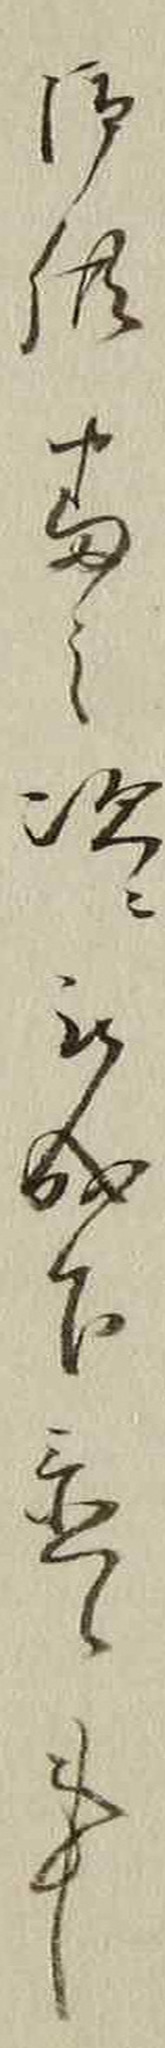御供番之次ニ被成下置候事
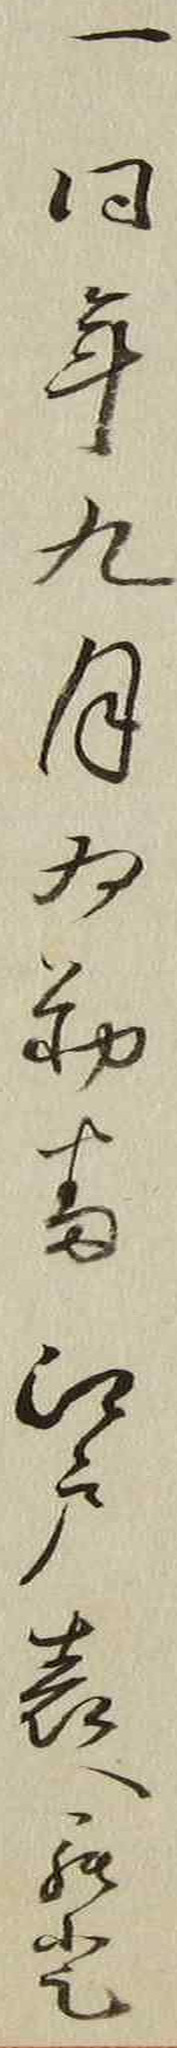一同年九月為勤番江戸表へ罷登
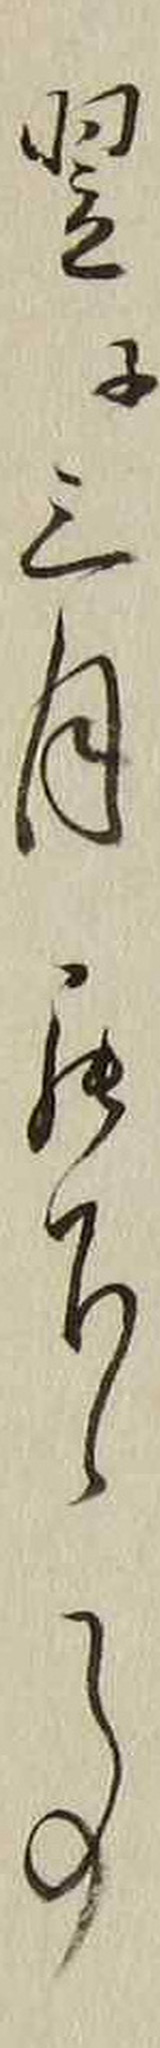翌子三月罷下候事
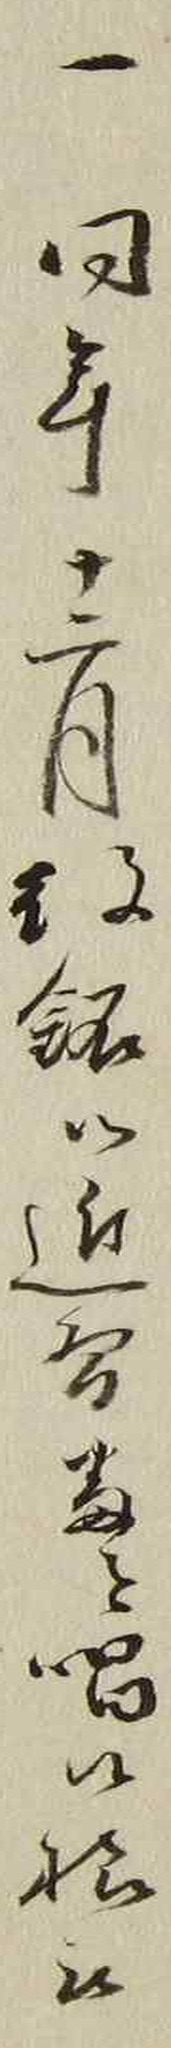一同年十二月役銘御近習番と唱候様被
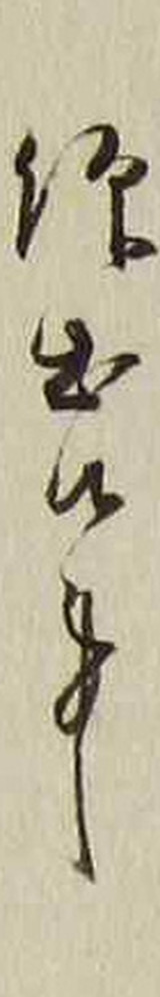仰出候事
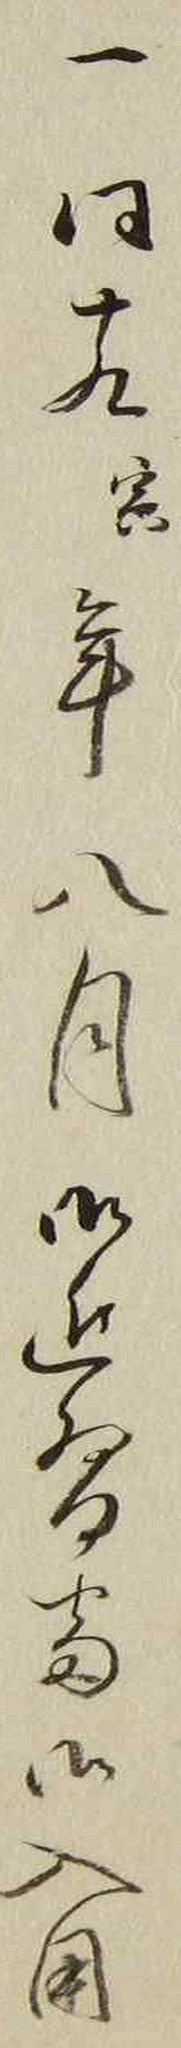一同十九寅年八月御近習番御入用
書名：諸士系譜　巻之32　い之部32
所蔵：会津若松市立会津図書館
